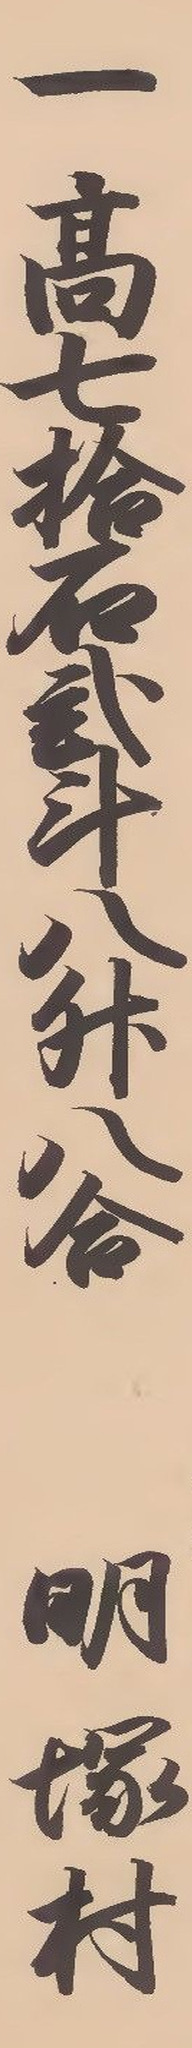一髙七拾石弐斗八升八合明塚村
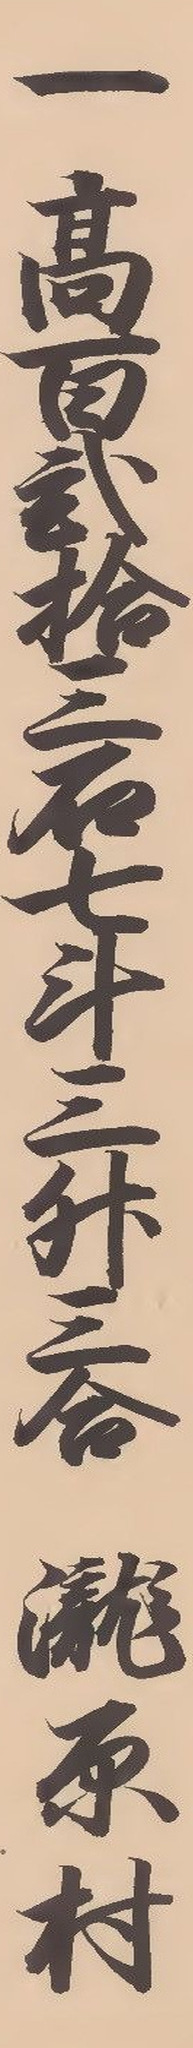一髙百弐拾三石七斗三升三合瀧原村
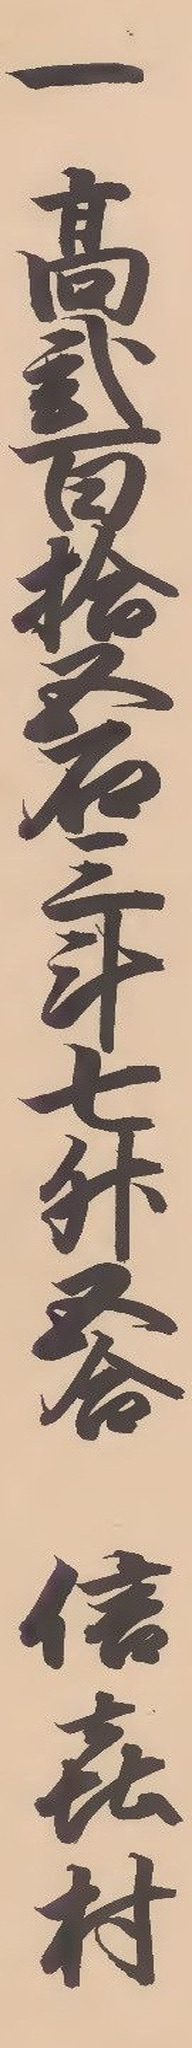一髙弐百拾五石三斗七升五合信喜村

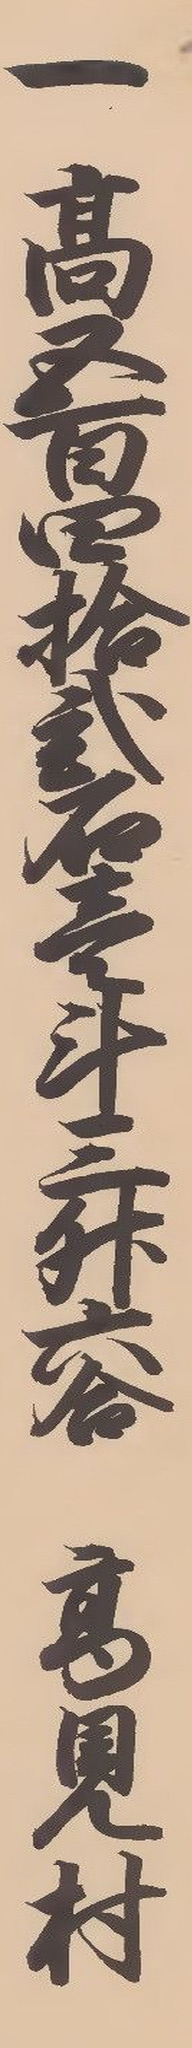一髙五百四拾弐石弐斗三升六合髙見村
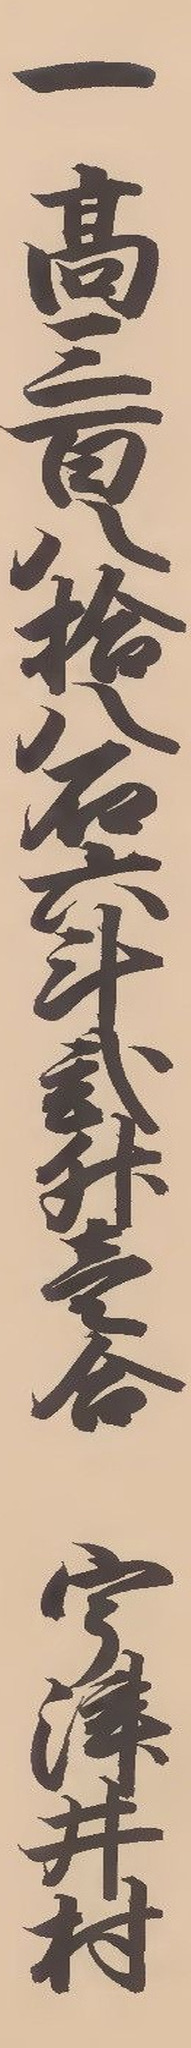一髙三百八拾八石六斗弐升壱合宇津井村
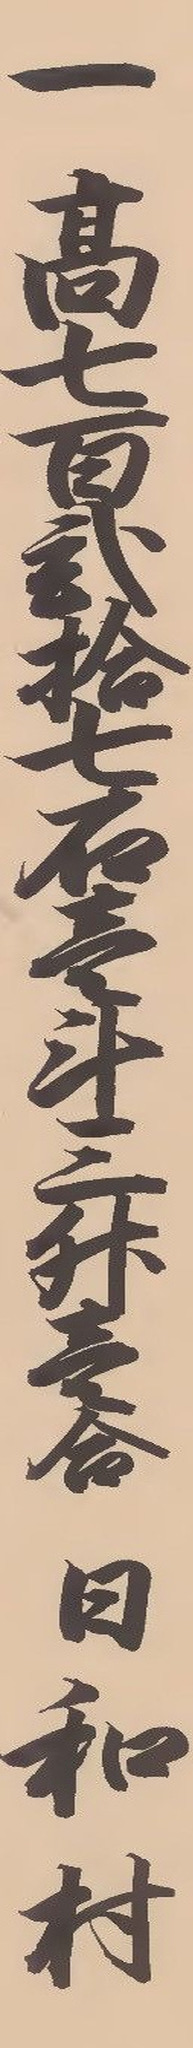一髙七百弐拾七石壱斗三升壱合日和村
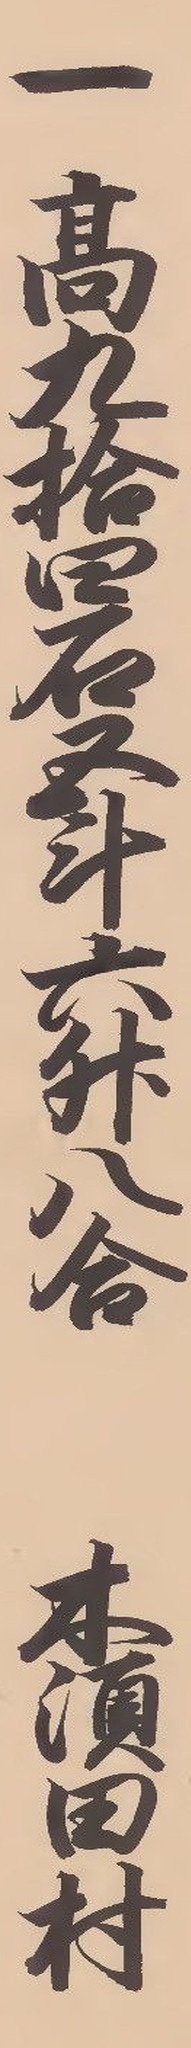一髙九拾四石五斗六升八合木須田村
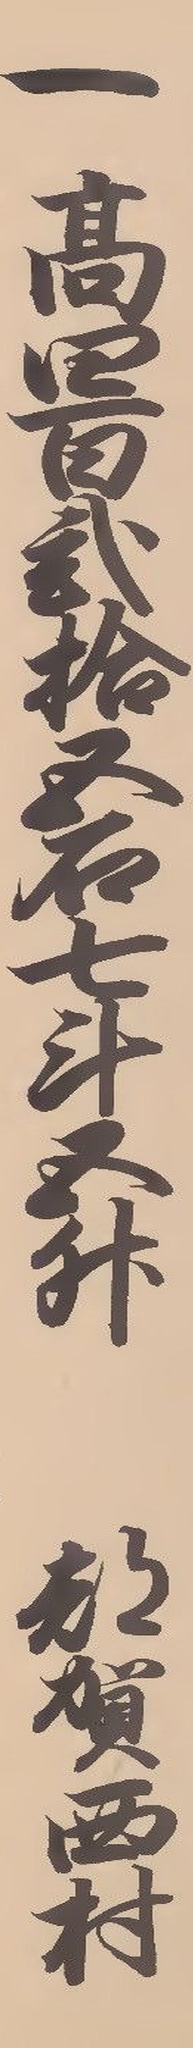一髙四百弐拾五石七斗五升都賀西村
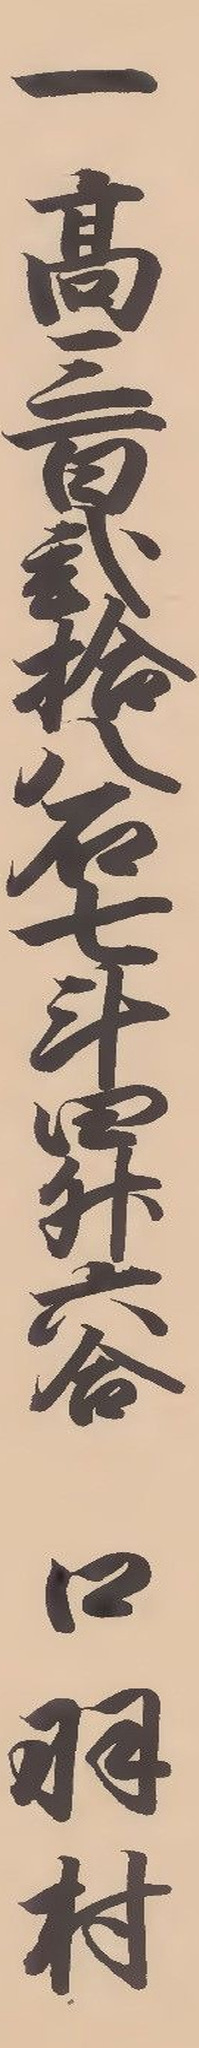一髙三百弐拾八石七斗四升六合口羽村
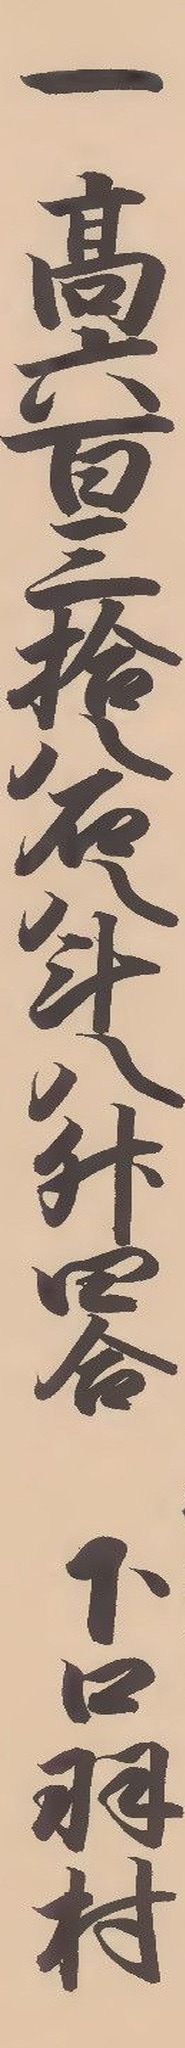一髙六百三拾八石八斗八升四合下口羽村
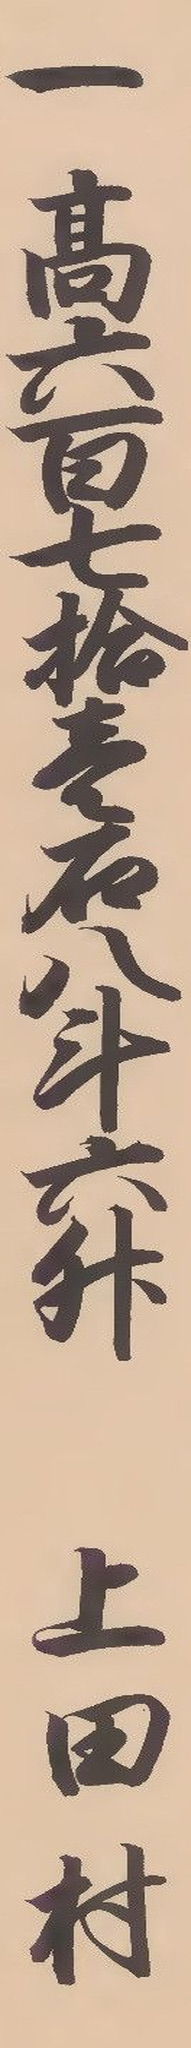一髙六百七拾壱石八斗六升上田村

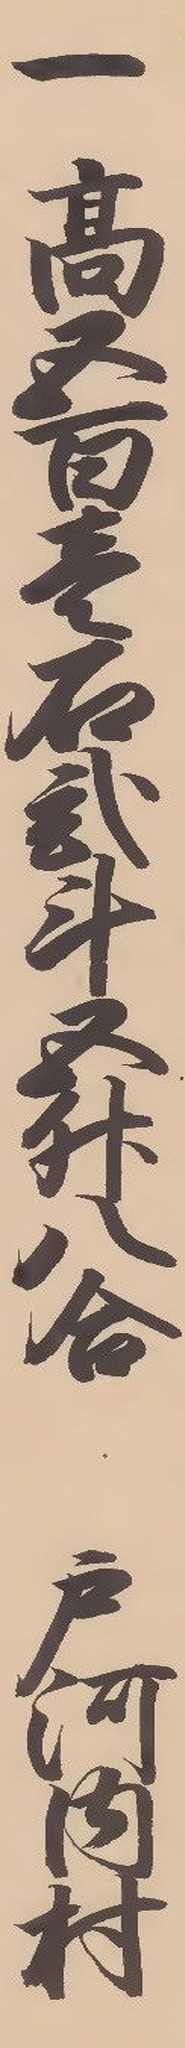一髙五百壱石弐斗五升八合戸河内村
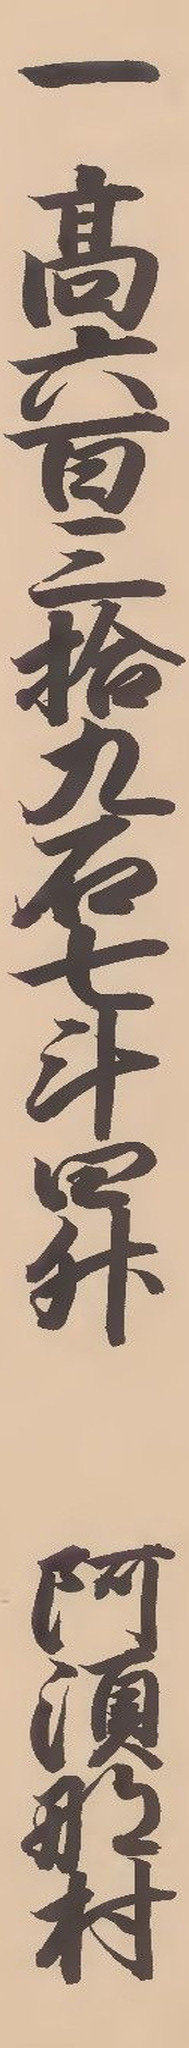一髙六百三拾九石七斗四升阿須那村
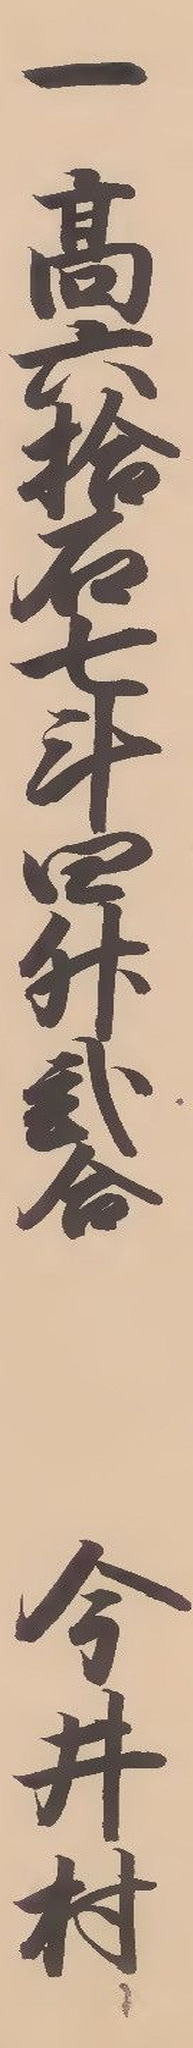一髙六拾石七斗四升弐合今井村
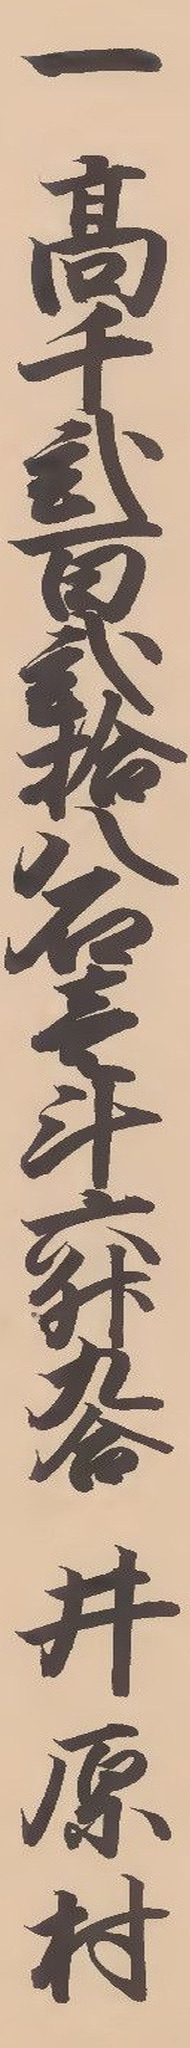一髙千弐百弐拾八石壱斗六升九合井原村
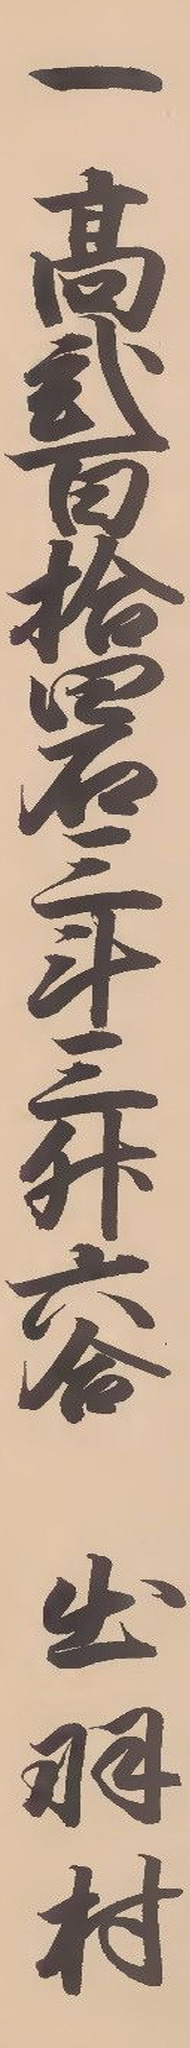一髙弐百拾四石三斗三升六合出羽村
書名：石見国郷帳
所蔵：国立公文書館 National Archives of Japan
